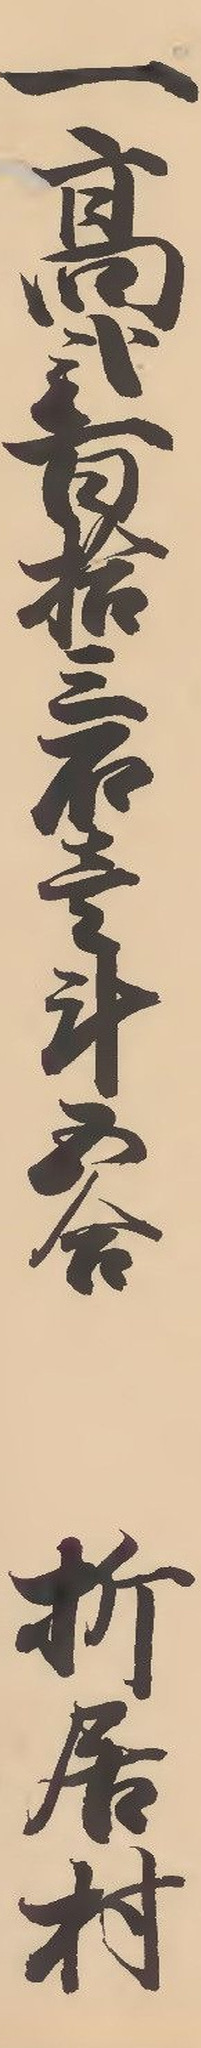一高弐百拾三石壱斗五合折居村
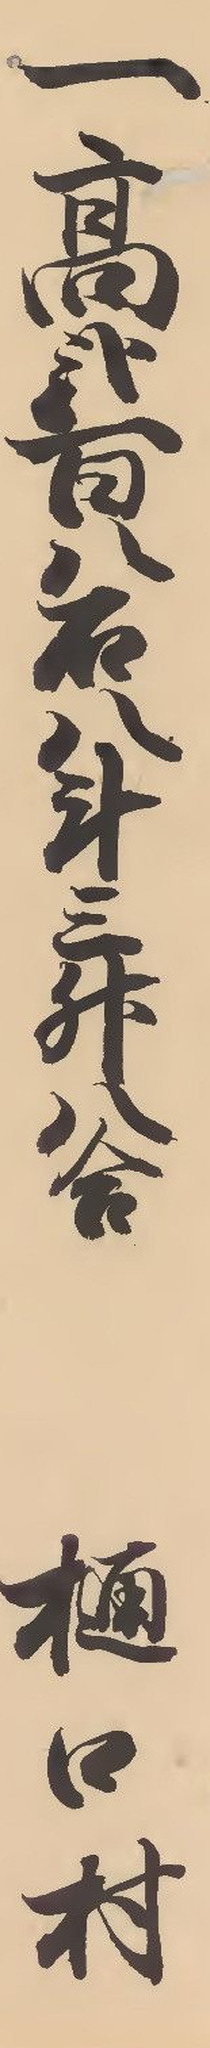一高弐百八石八斗三升八合樋口村
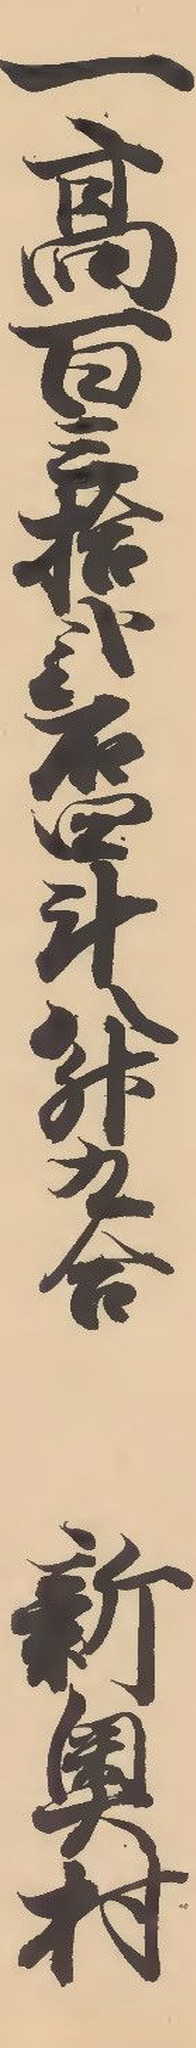一高百三拾弐石四斗八升九合新奥村
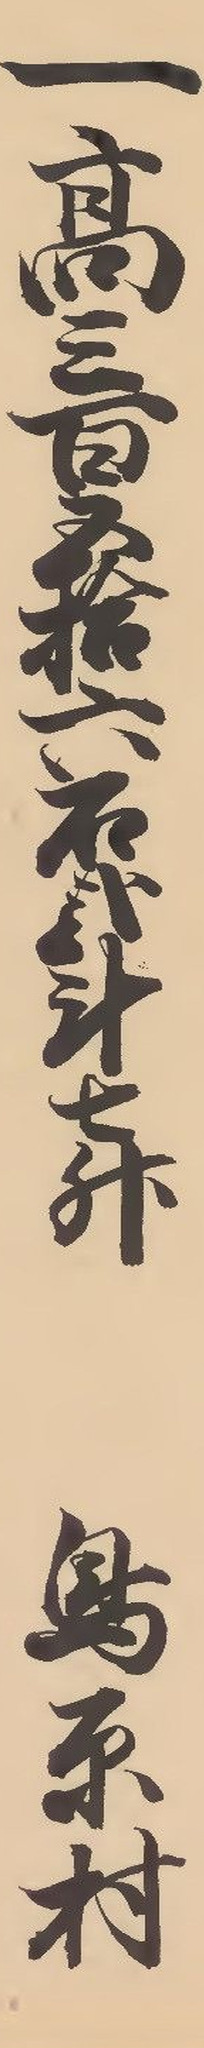一高三百五拾六石弐斗七升鳥原村
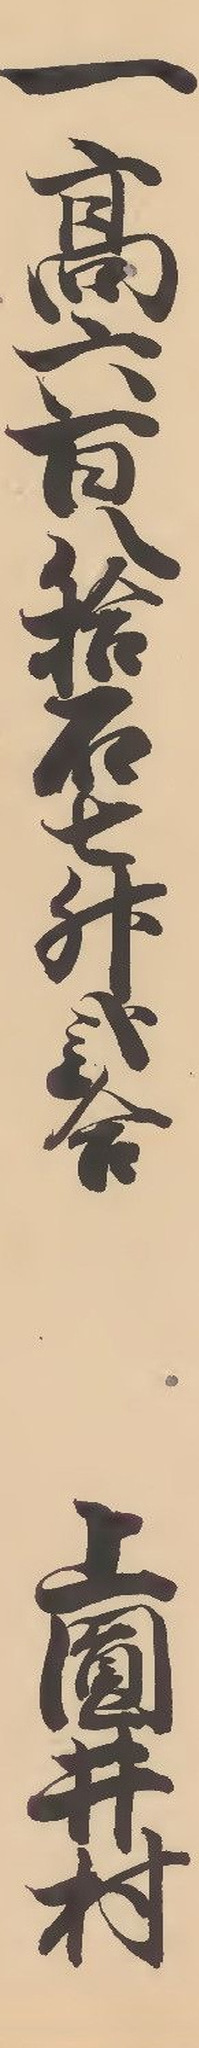一高六百八拾石七升弐合上円井村

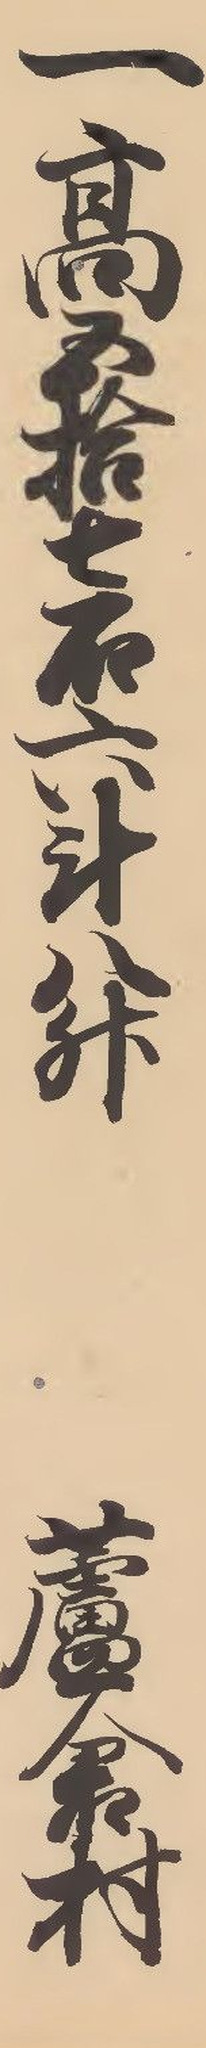一高五拾七石六斗八升蘆倉村
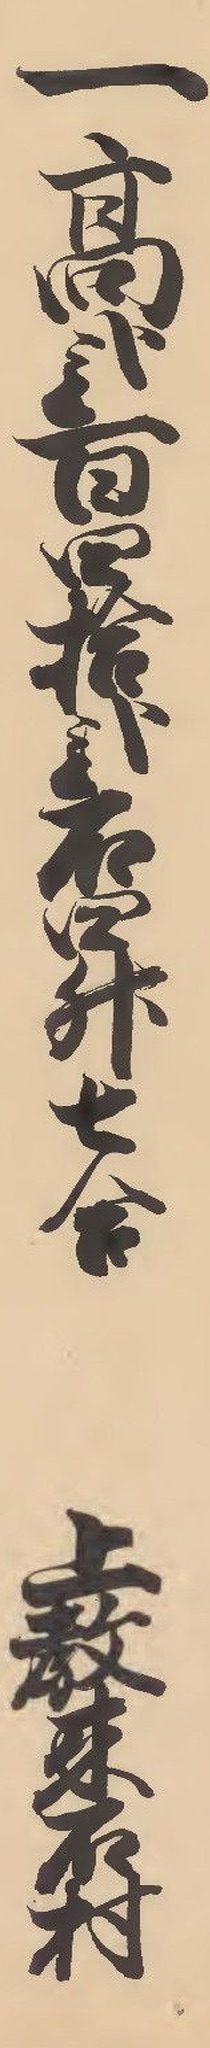一高弐百四拾弐石四升七合上教来石村
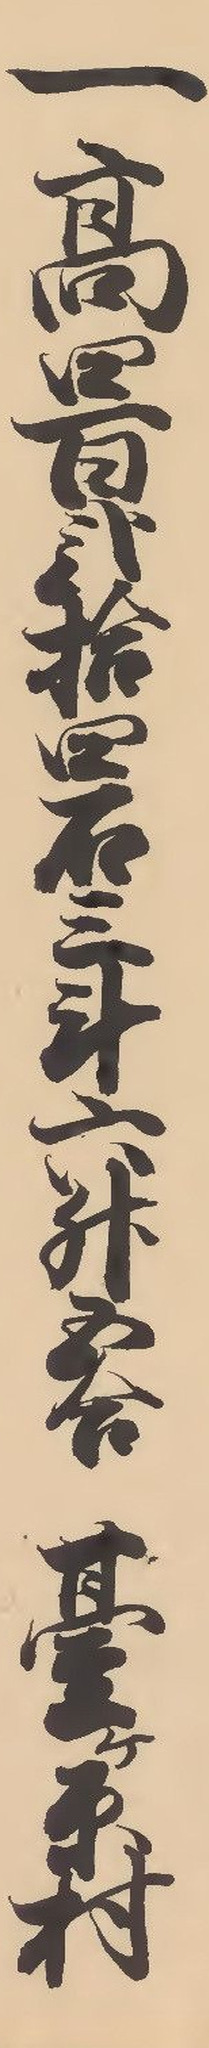一高四百弐拾四石三斗六升五合台ヶ原村
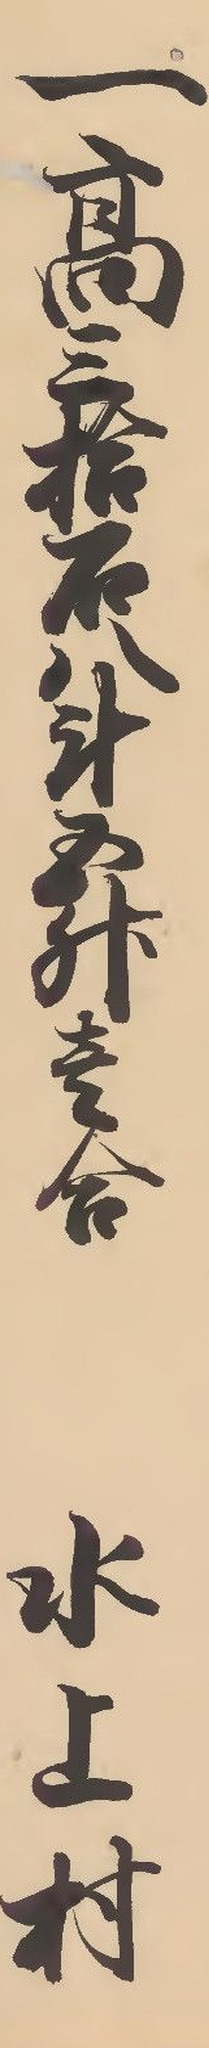一高三拾石八斗五升壱合水上村
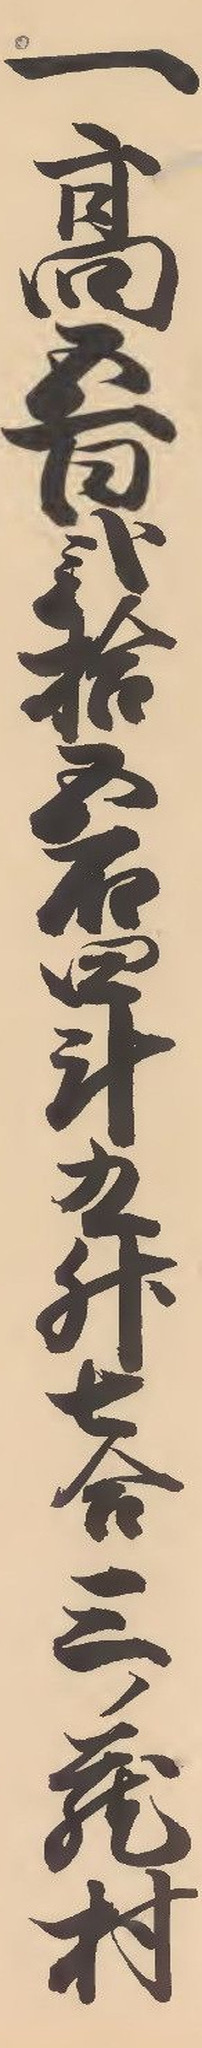一高五百弐拾五石四斗九升七合三ノ蔵村
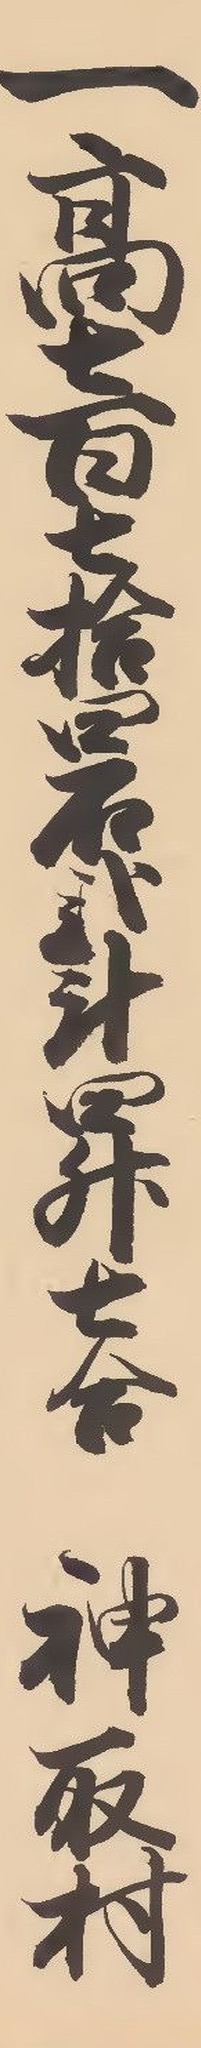一高七百七拾四石弐斗四升七合神取村
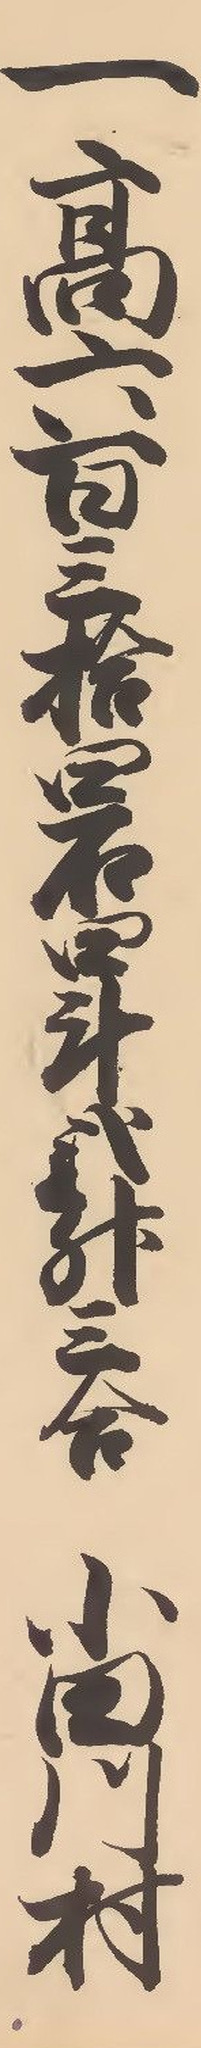一高六百三拾四石四斗弐升三合小田川村
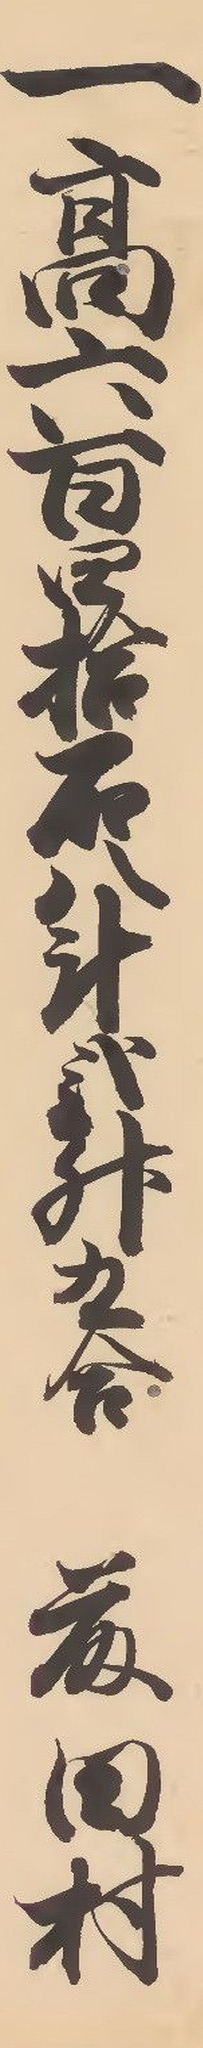一高六百四拾石八斗弐升九合藤田村

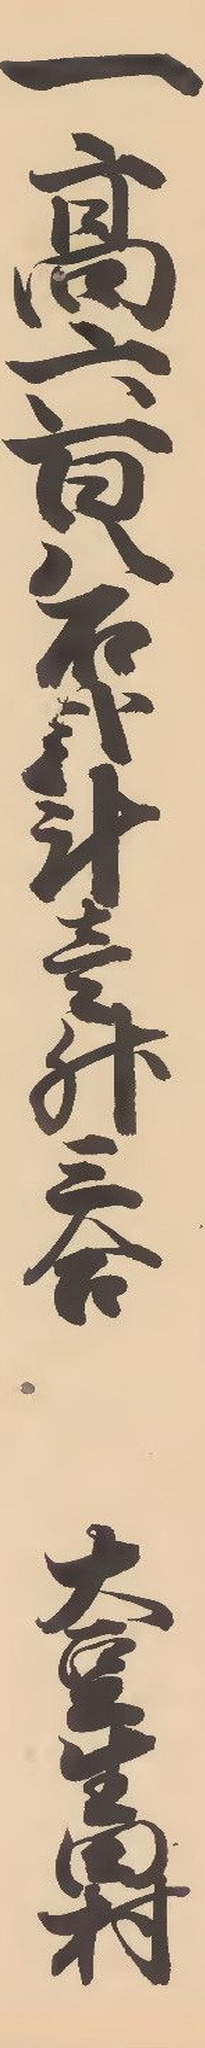一高六百八石弐斗壱升三合大豆生田村
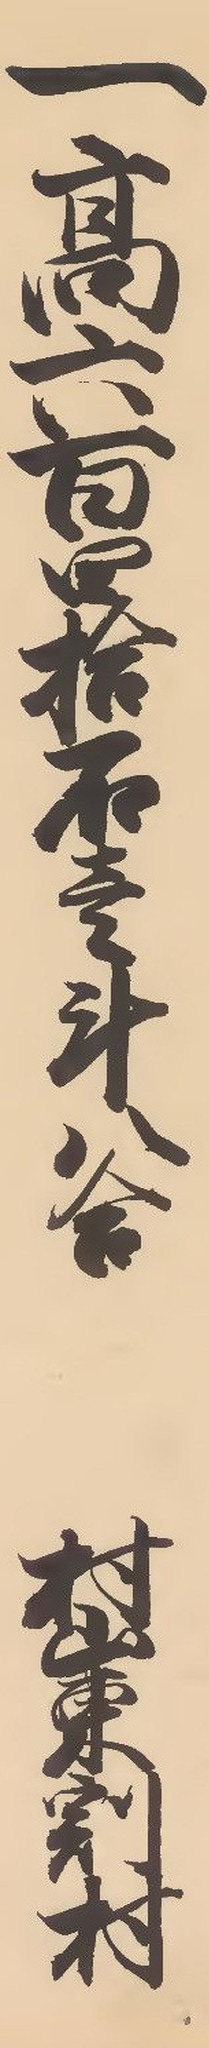一高六百四拾石壱斗八合村山東割村
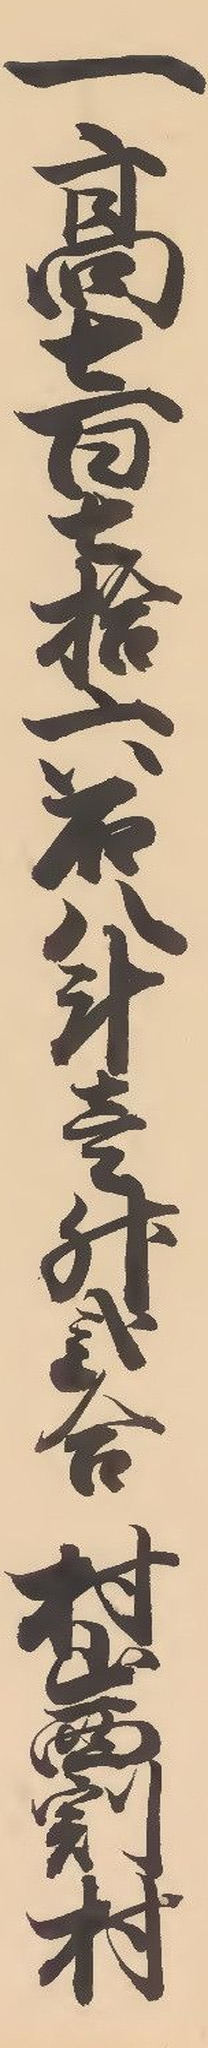一高七百七拾六石八斗壱升弐合村山西割村
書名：甲斐国郷帳
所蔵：国立公文書館 National Archives of Japan
